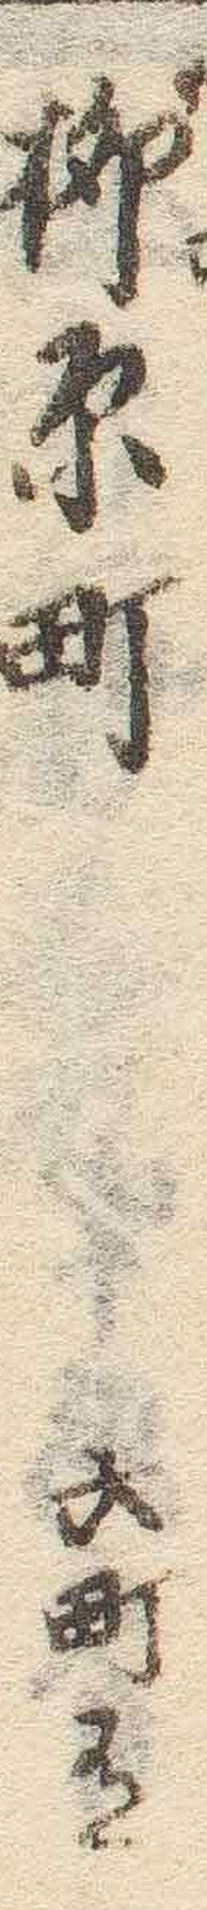柳原町六町有
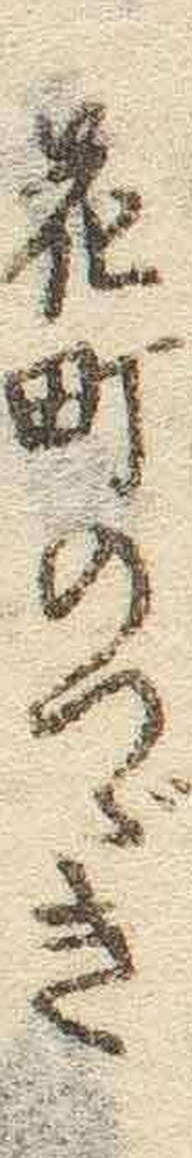花町のつゞき
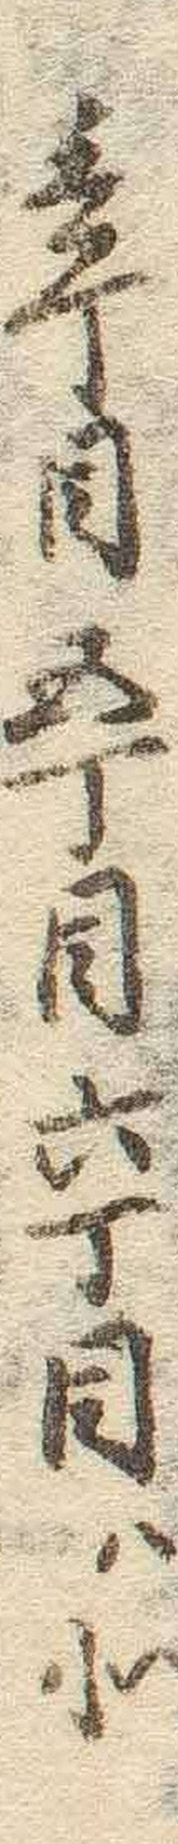壱丁目五丁目六丁目は北
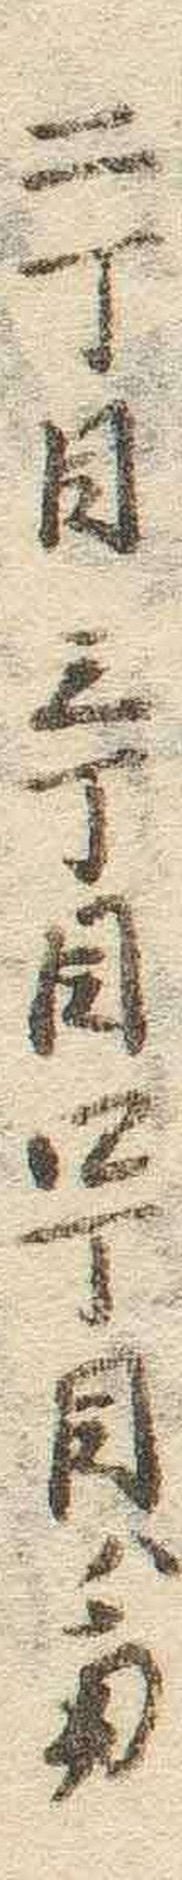二丁目三丁目四丁目は南
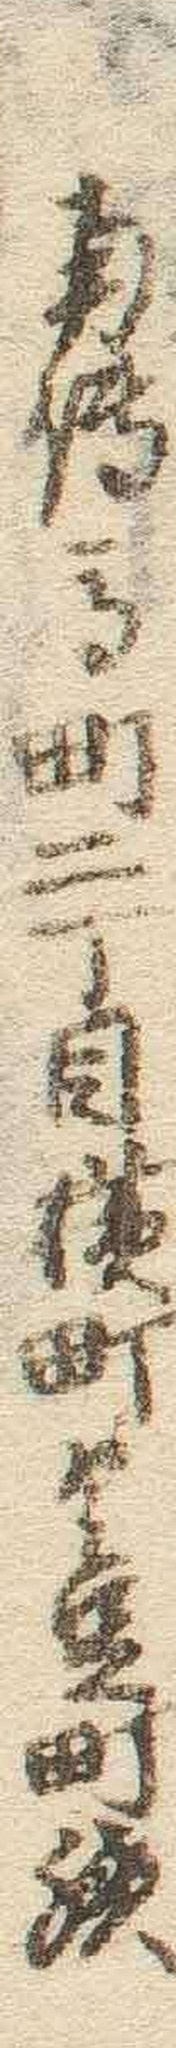南伝馬町二丁目横町具足町続
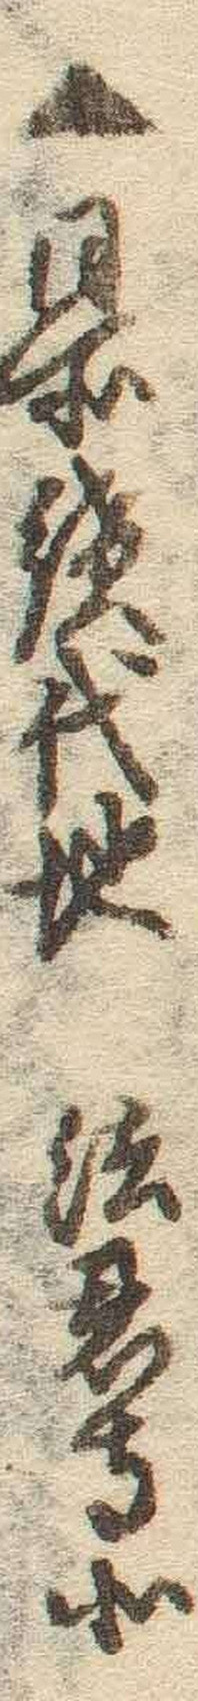▲同所続代地法恩寺北
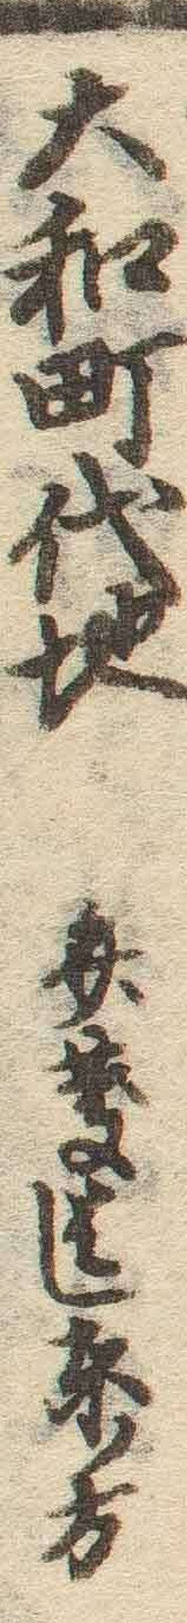大和町代地弁慶はし東ノ方

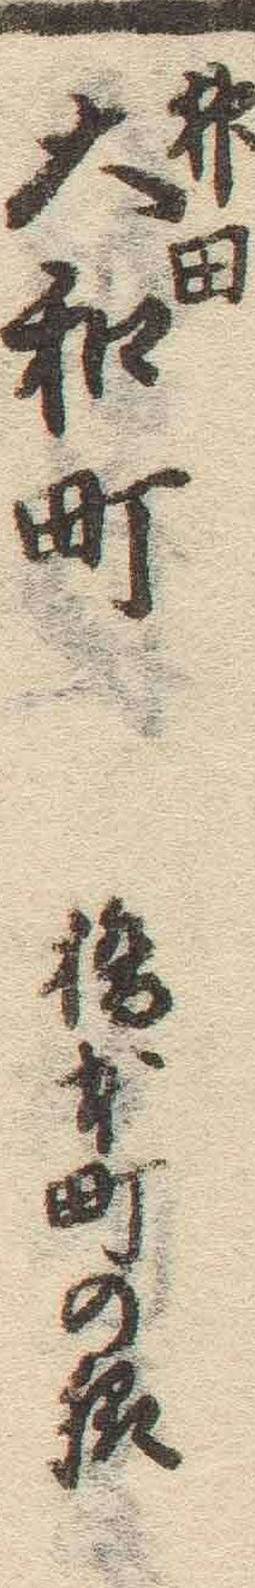大和町橋本町の脇
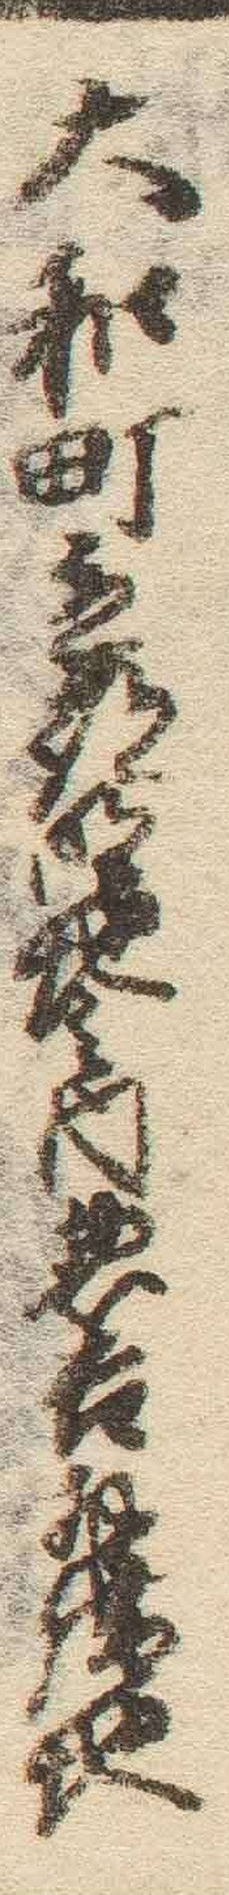大和町立跡明地之内惣吉拝借地
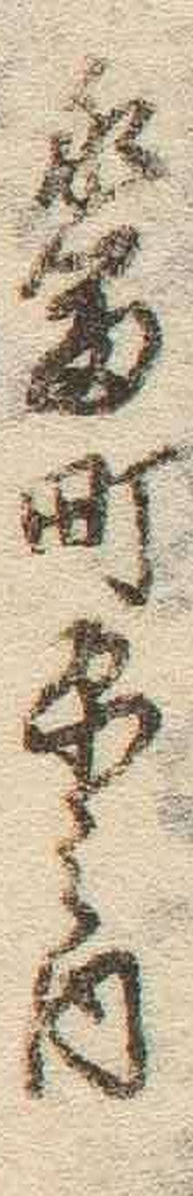永富町原之内
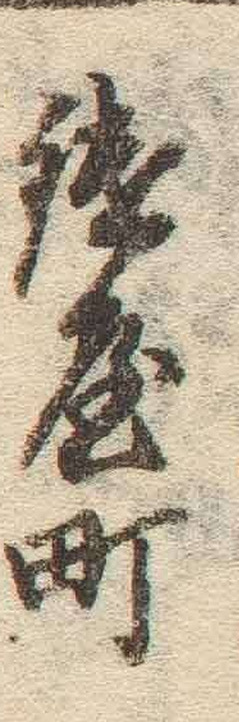鑓屋町
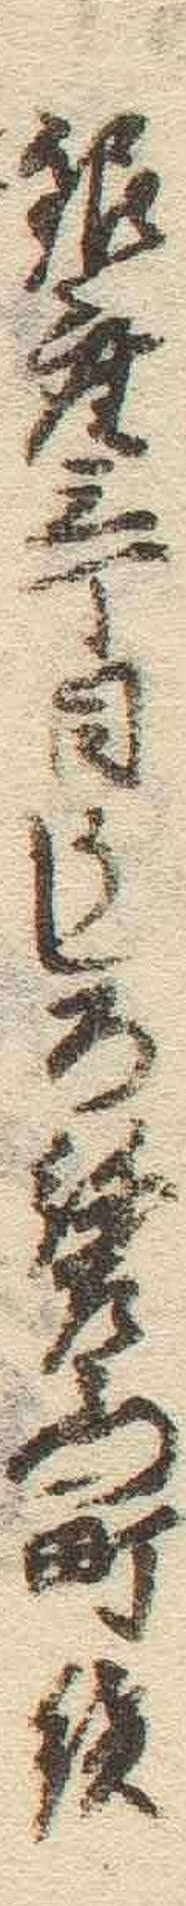銀座三丁目うしろ弥左衛門町続
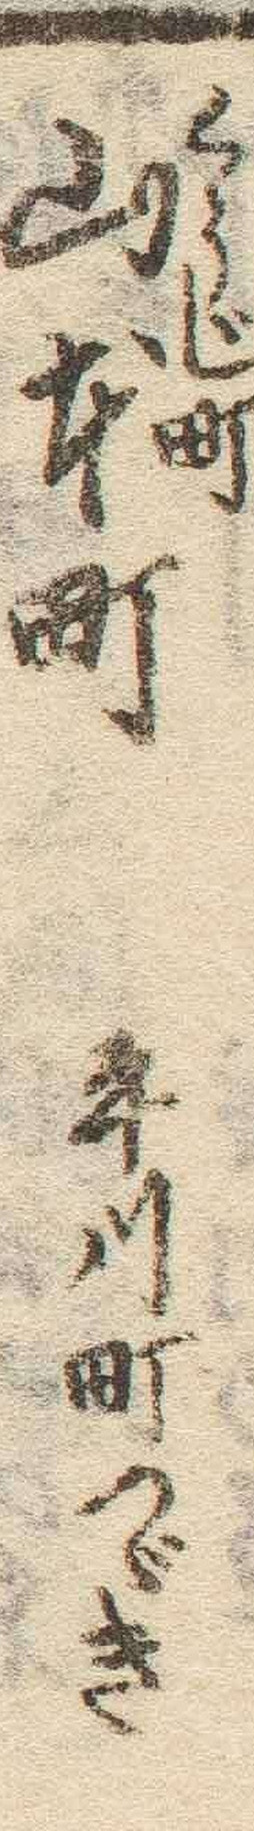山本町平川町つゞき
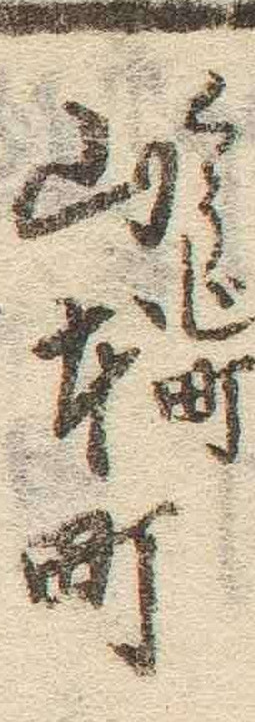山本町
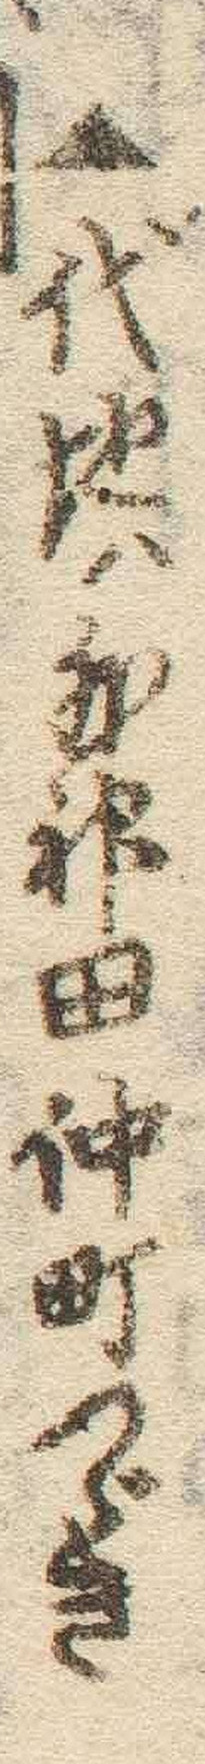▲代地は外神田仲町つゞき
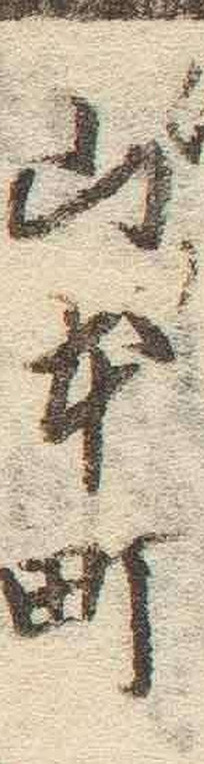山本町
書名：江戸町独案内
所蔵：東京学芸大学附属図書館 国文学研究資料館
